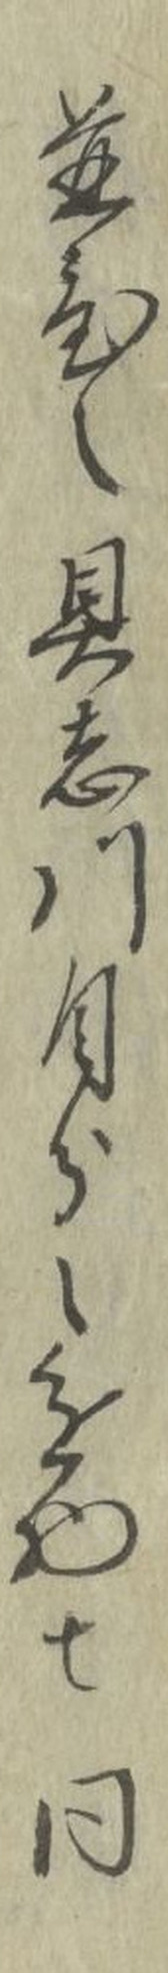並置之具志川自分之進物は同
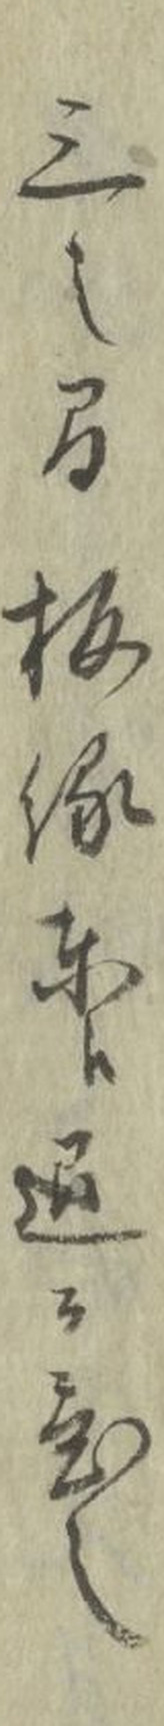三之間板縁東え退而置之
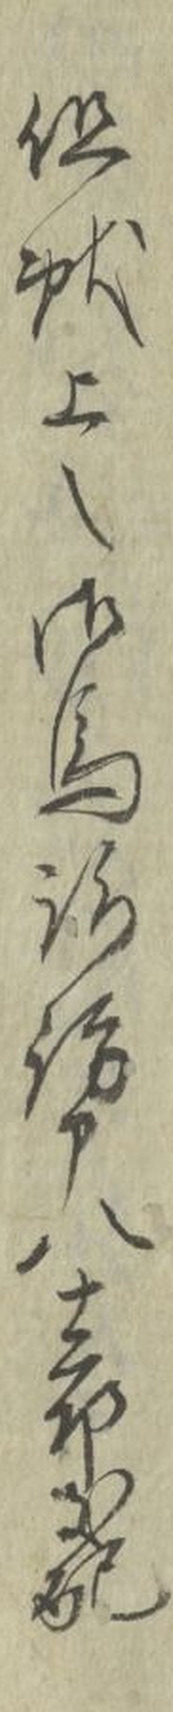但献上之御馬諏訪部八十郎支配
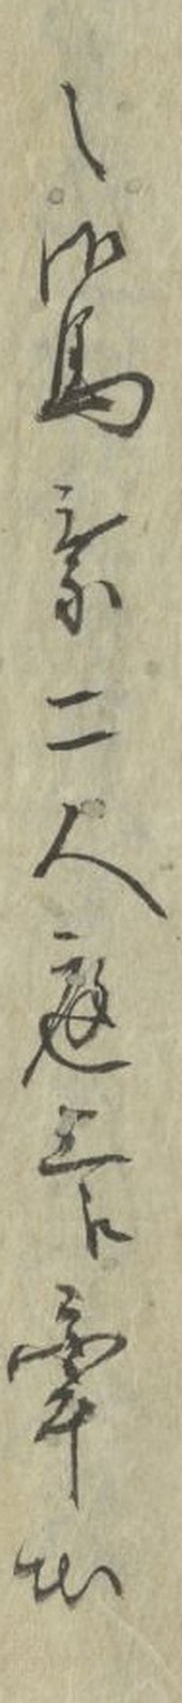之御馬乗二人庭上え牽出
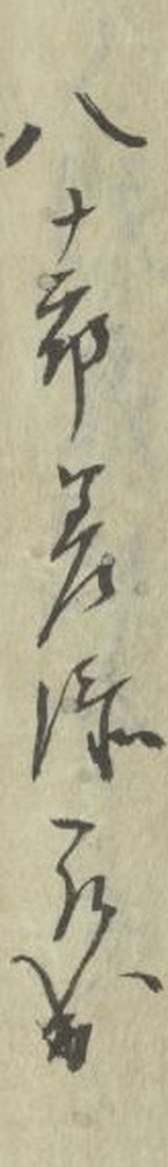八十郎差添罷出
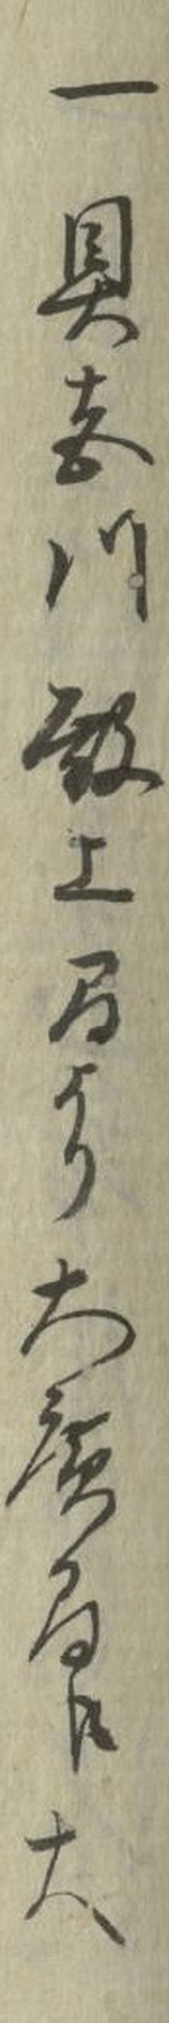一具志川殿上間より大広間え大
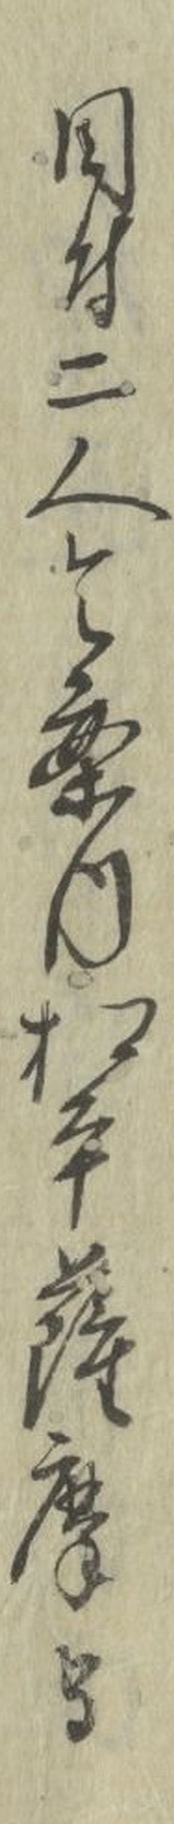目付二人令案内松平薩摩守
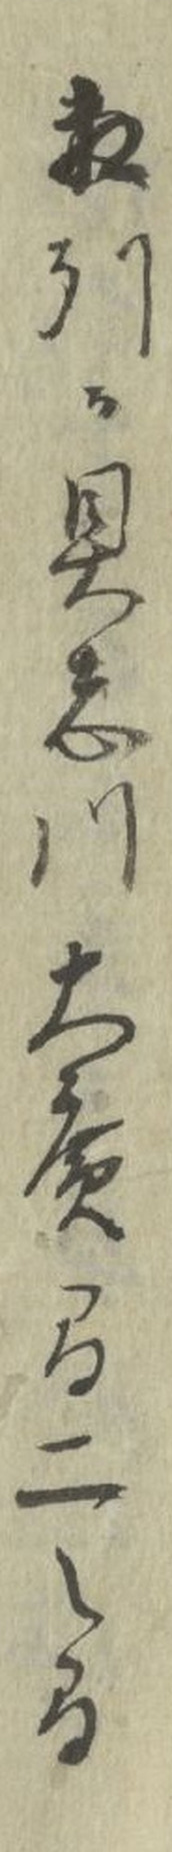相列而具志川大広間二之間
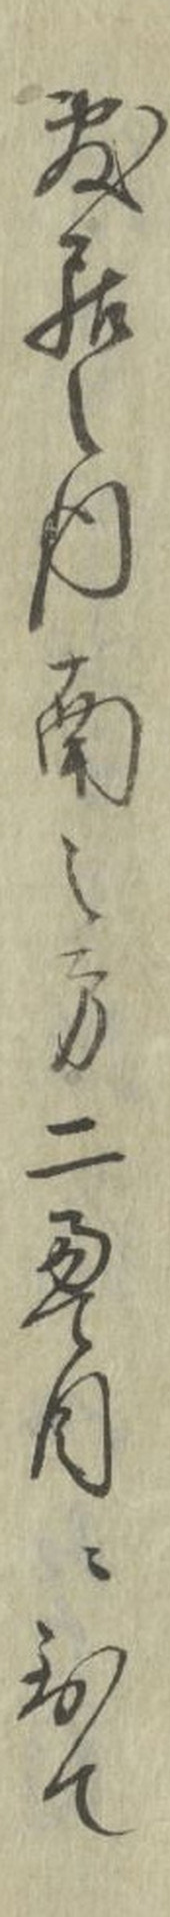敷居之内南之方二畳目に到て
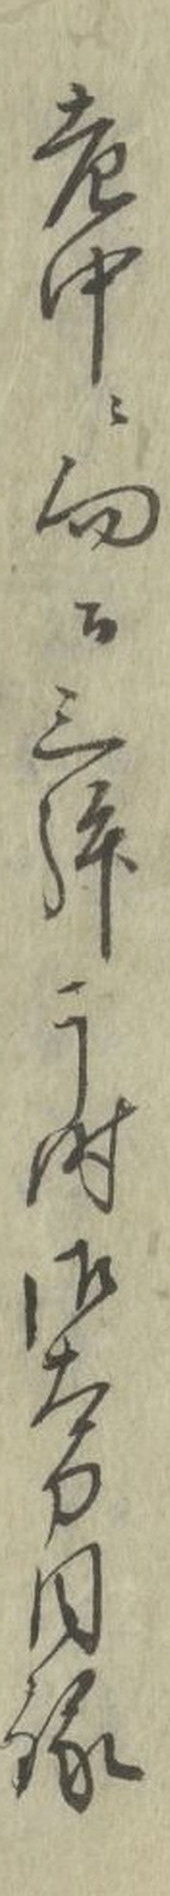老中に向而三拝于時御太刀目録

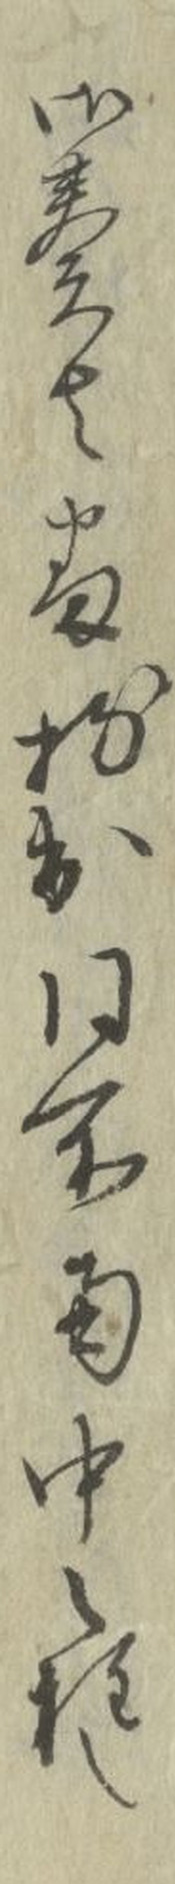御奏者番持出同所南中之柱之
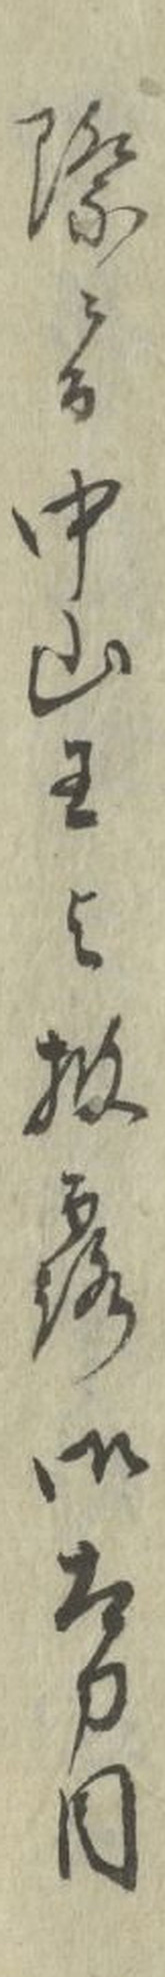際に而中山王と披露御太刀目
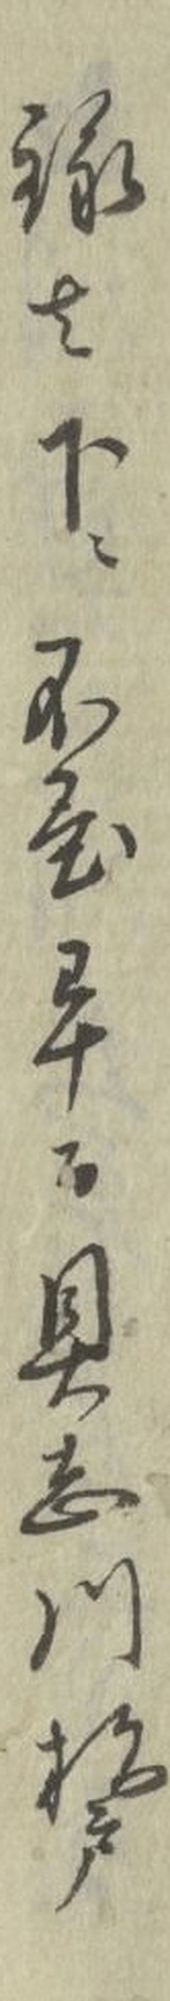録は下に不置畢而具志川指戸
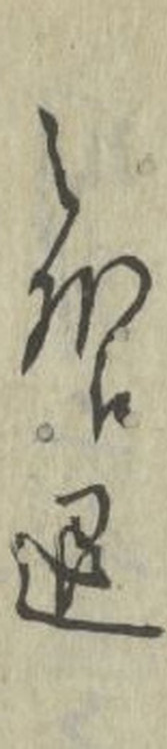之外え退
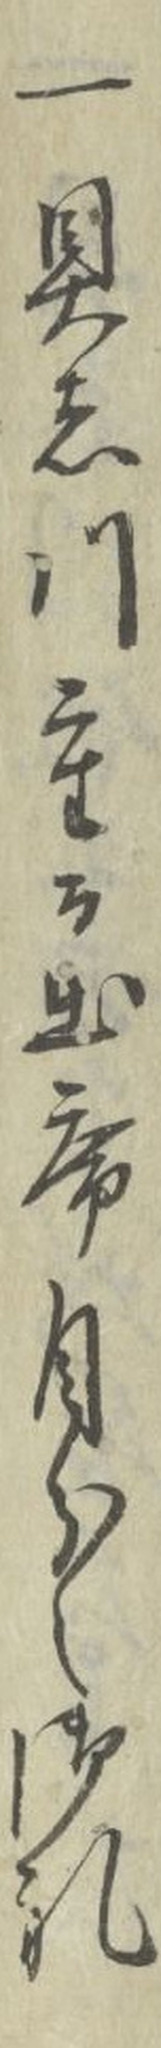一具志川重而出席自分之御礼
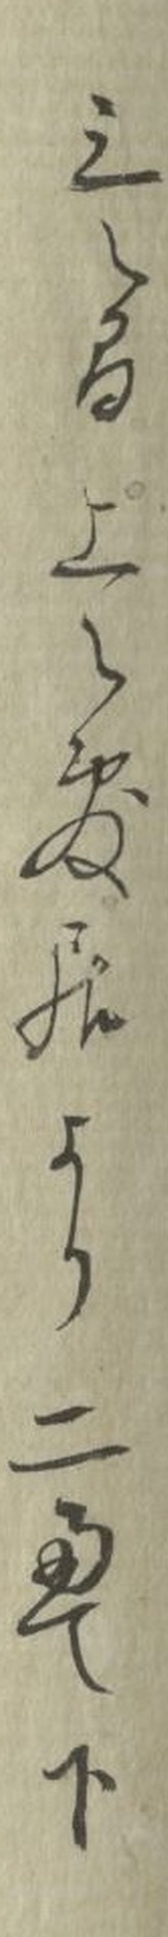三之間上之敷居より二畳下
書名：琉球来朝記 自八至十四終
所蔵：University of the Ryukyus Library
